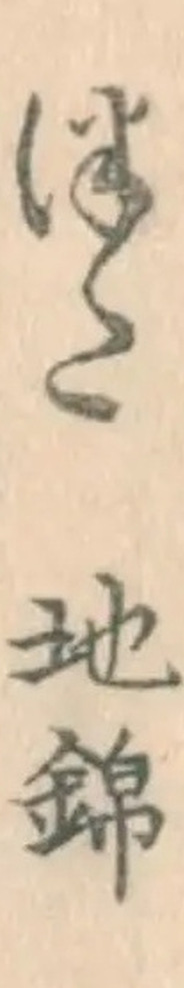つた地錦
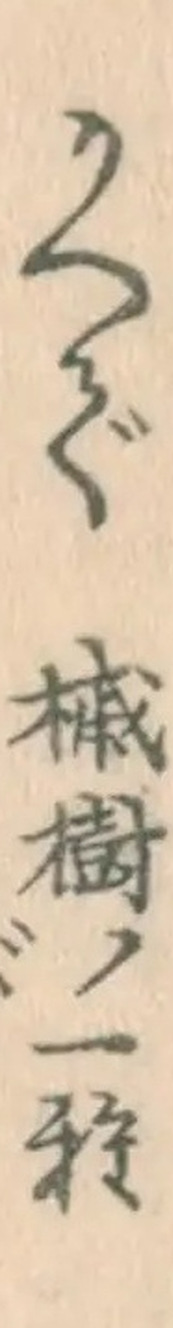かへで槭樹の一種
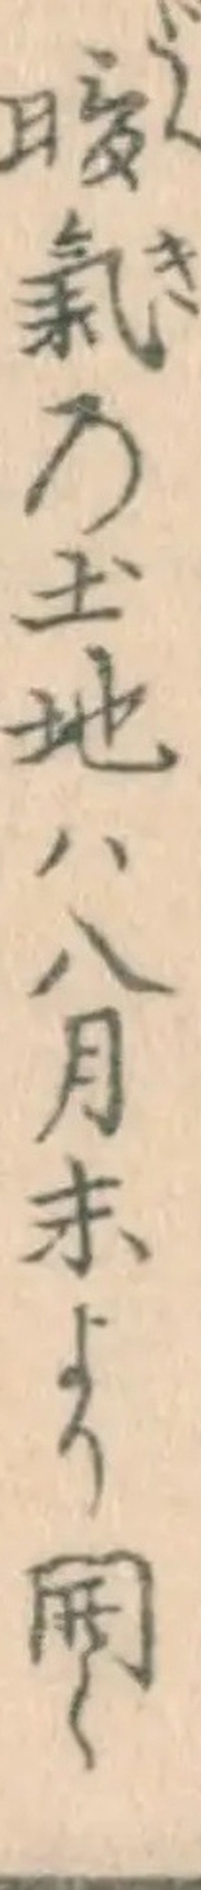水仙暖気の土地ハ八月末より開く
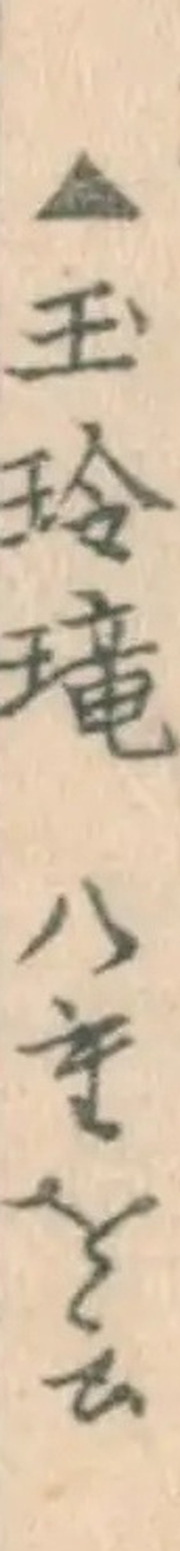▲玉玲瓏八重を云
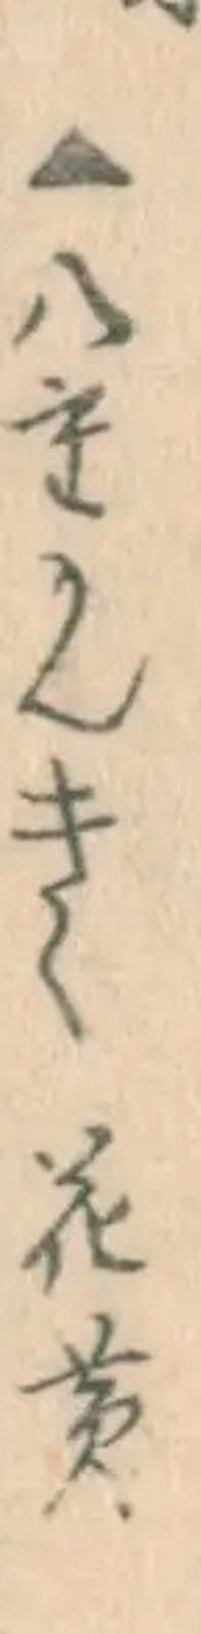▲八重かんきく花黄
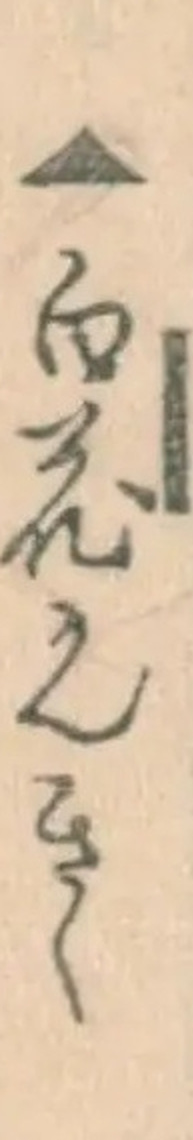▲白花かんきく
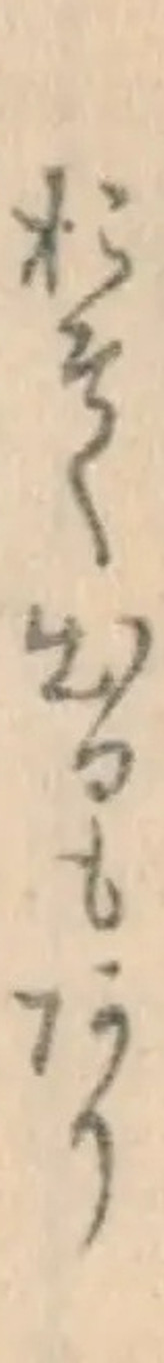ほそく出るもあり
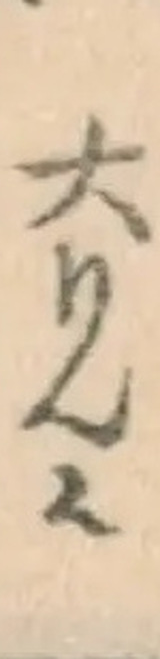大りん也
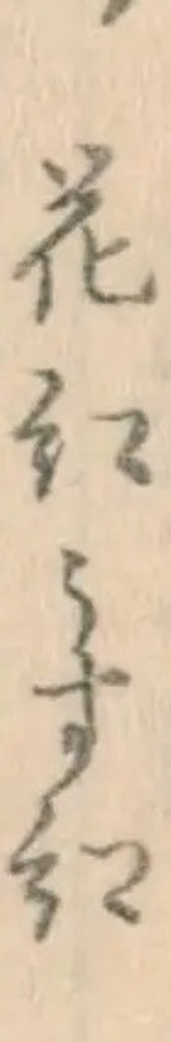花紅うす紅
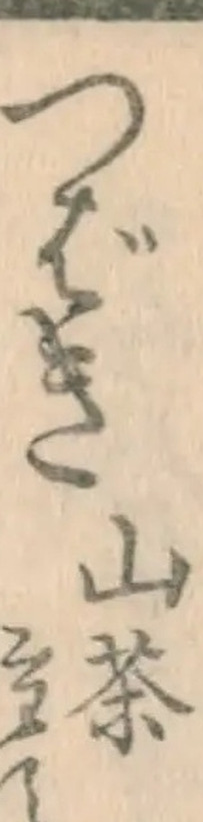つばき山茶
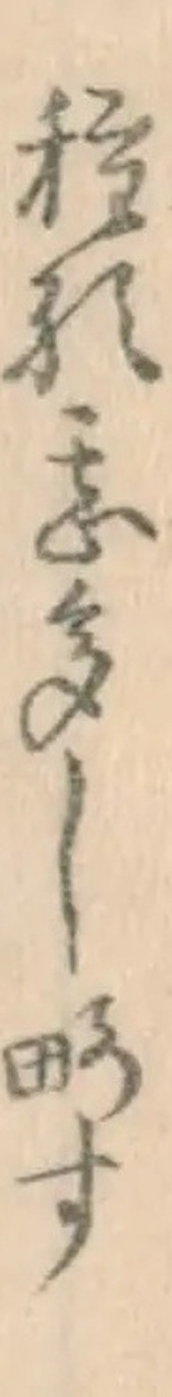種類甚多し略す
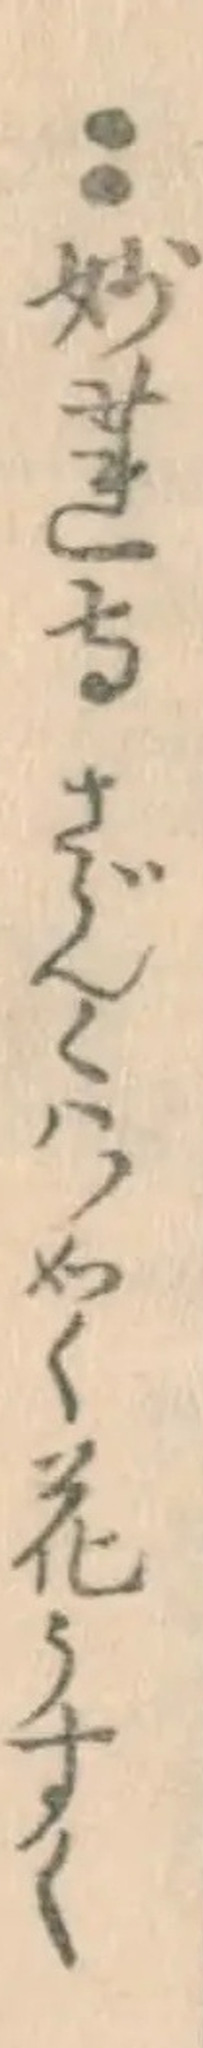●●妙蓮寺さざんくハノ如く花うすく
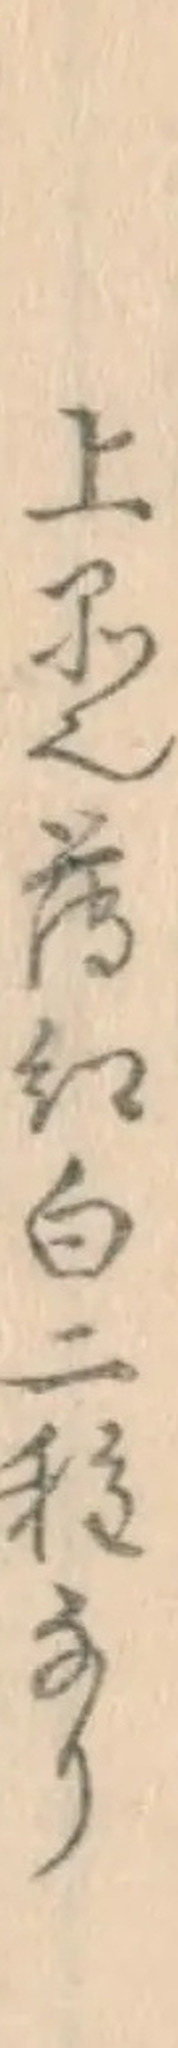上品なり薄紅白になり
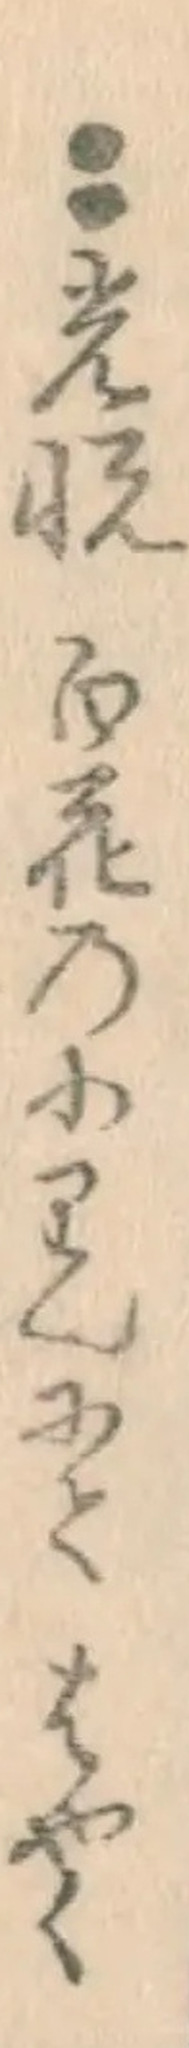●●光悦白花の小りんにてはやく
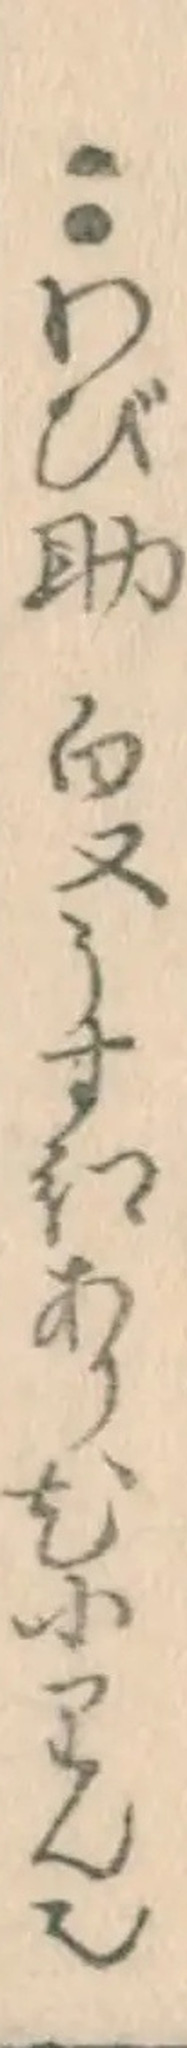●●わび助白又はうす紅あり尤小りん也
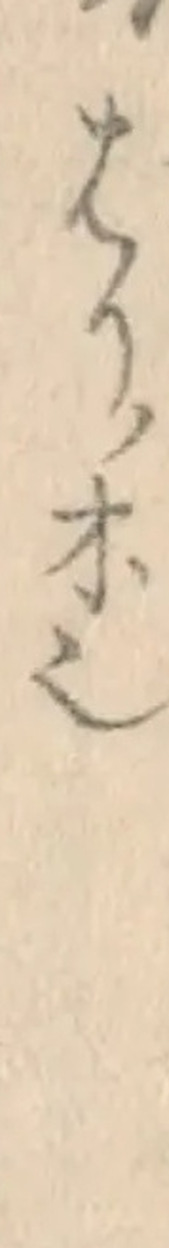はりノ木也
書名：茶席挿花集
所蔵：国立国会図書館 National Diet Library, JAPAN
